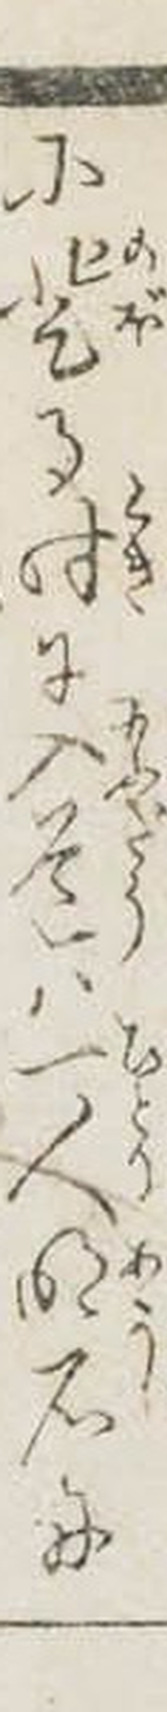に登る時に入道は一人明石に
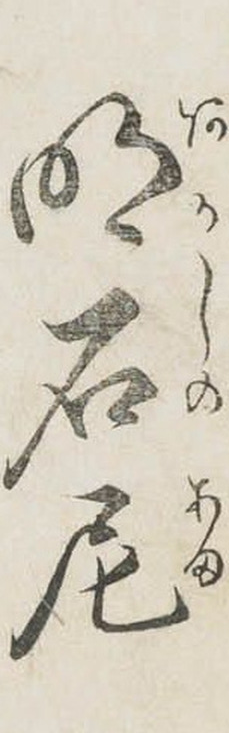明石尼
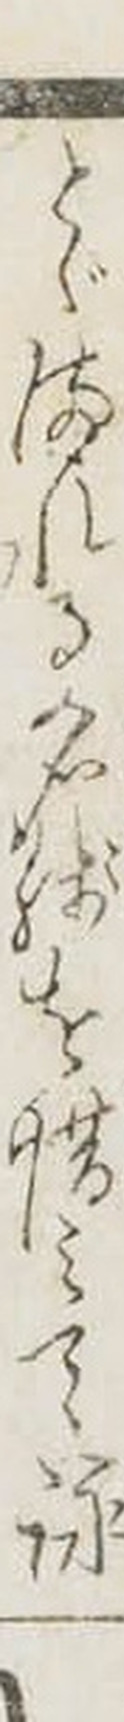とゞまれる名残を惜みて詠
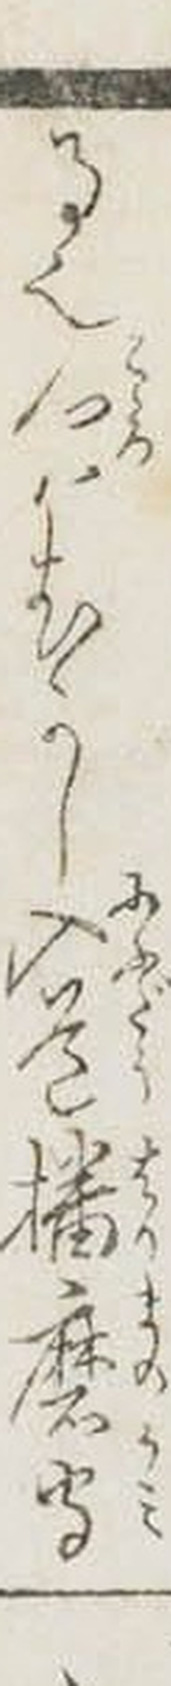る也心はむかし入道は播磨守
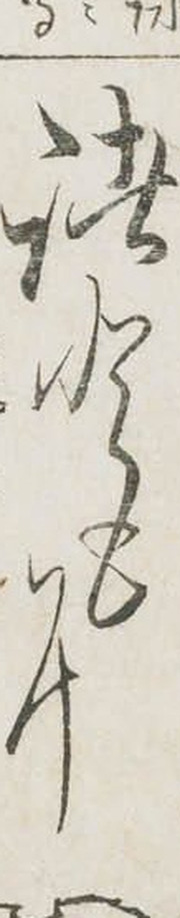諸ともに
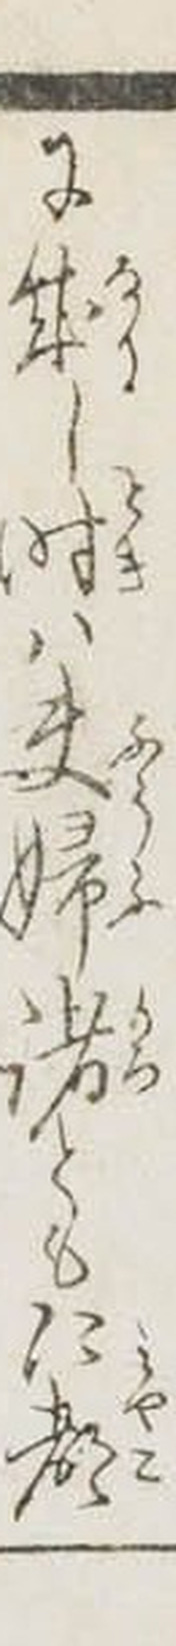に成し時は夫婦諸ともに都
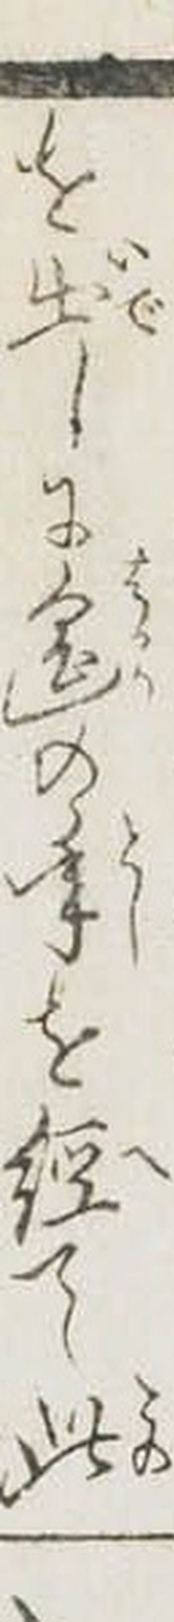を出しに遙の年を経て此
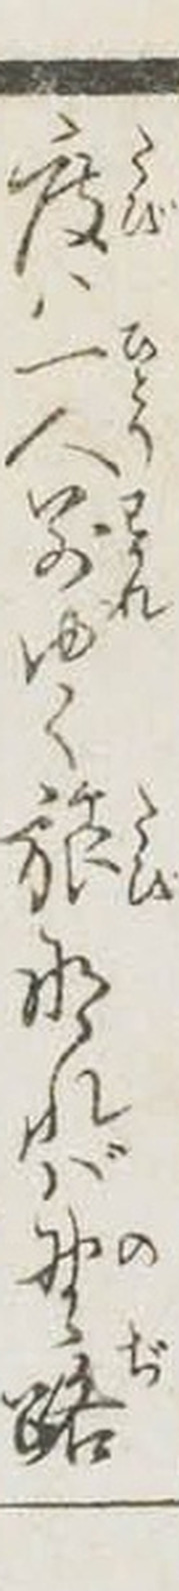度は一人別ゆく旅なれば野路
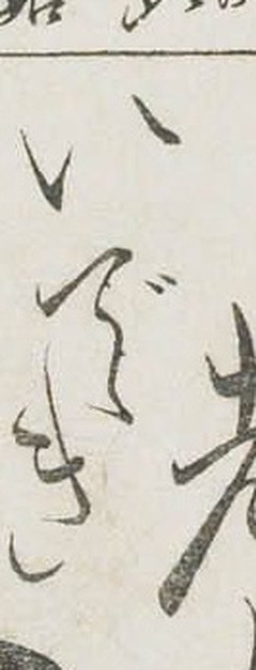いでき
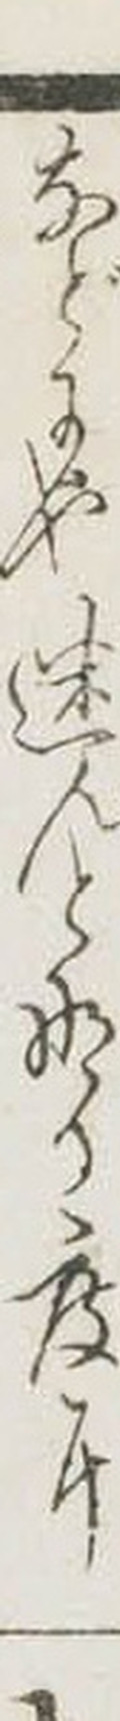などにや迷んとなり度に
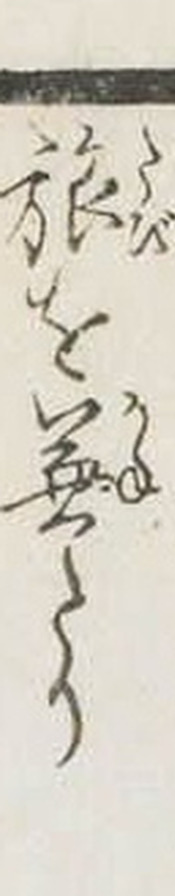旅を兼たり
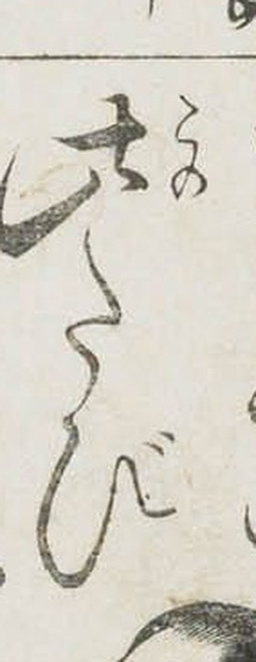此たび
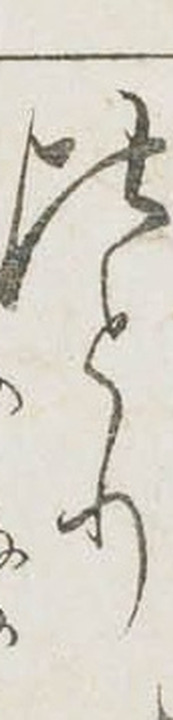ひとり
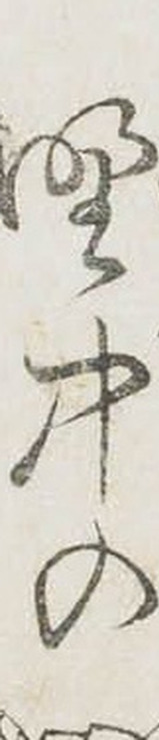野中の
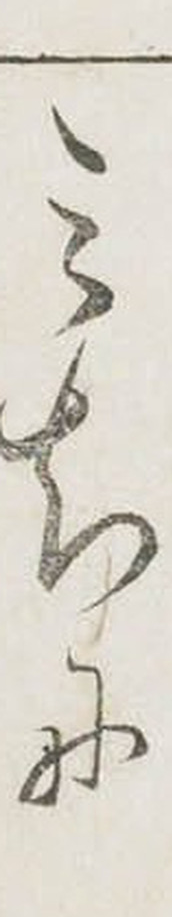みちに
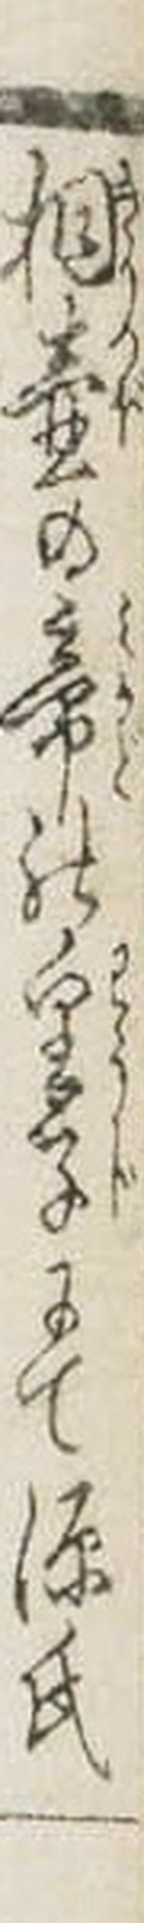桐壺の帝の皇子にて源氏
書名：源氏百人一首
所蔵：東京学芸大学教育コンテンツアーカイブ
